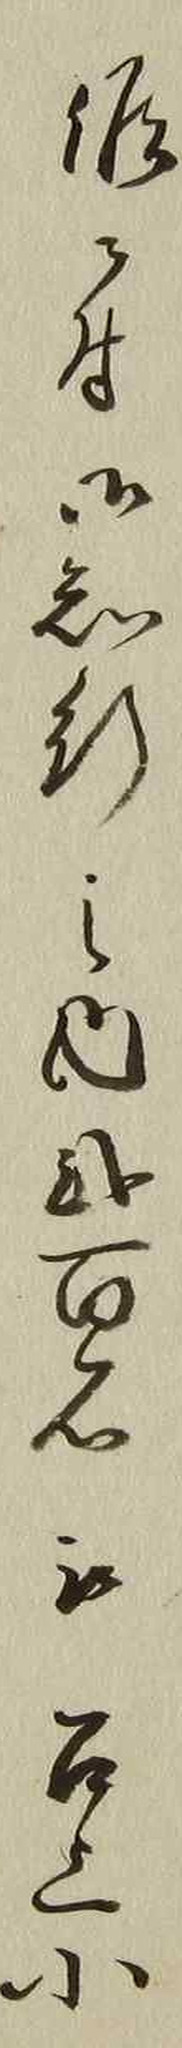候ニ付御知行之内弐百石被召上小
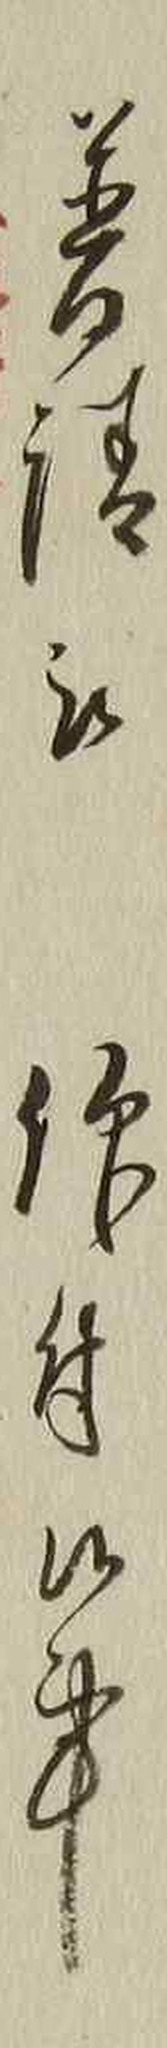普請被仰付候事
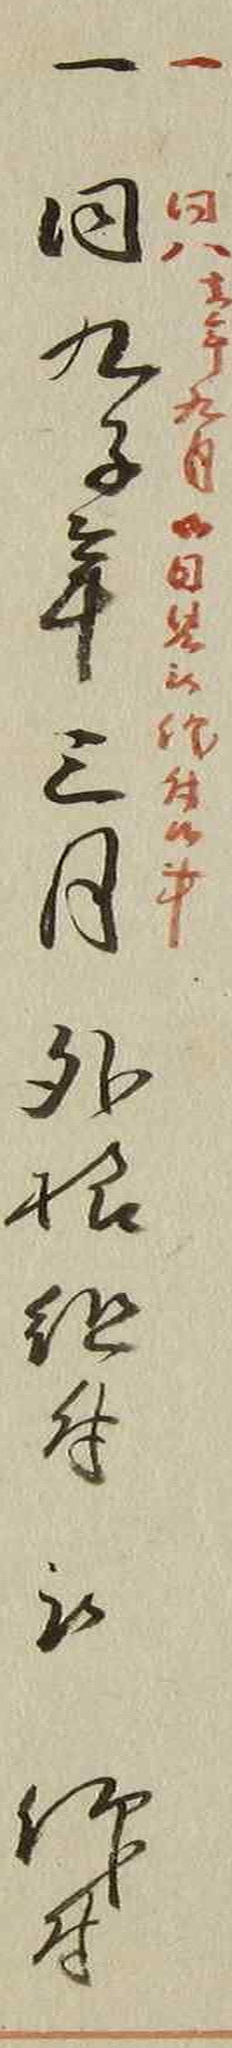一同九子年三月外様組付被仰付
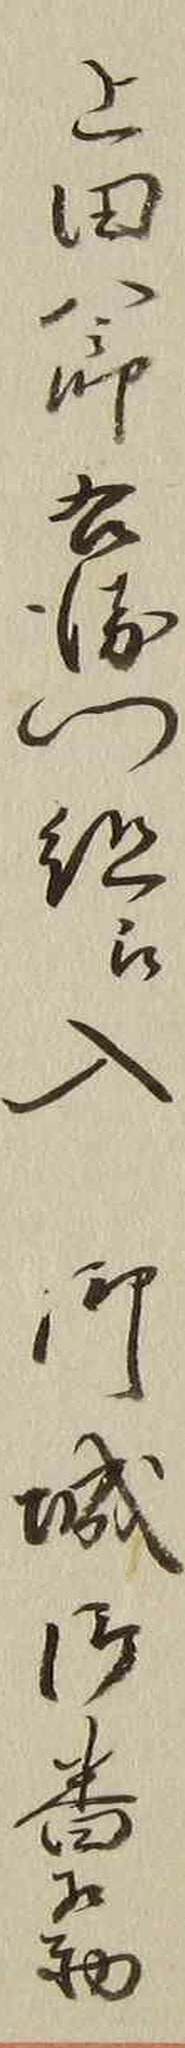上田八郎右衛門組江入御城御番相勤
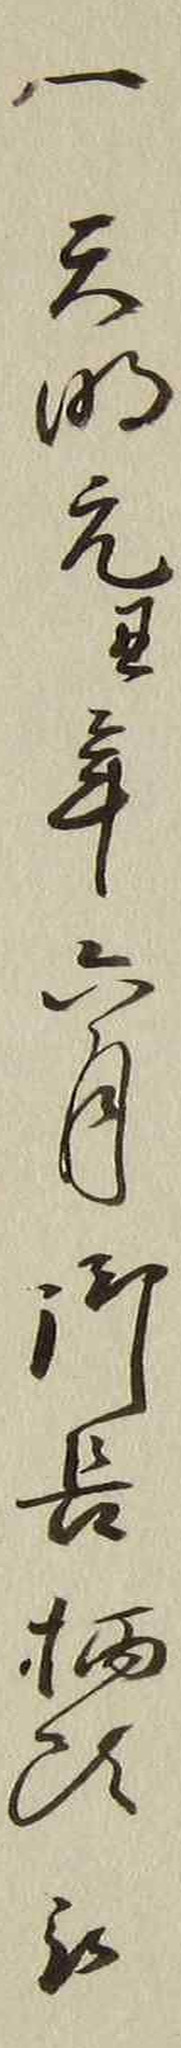一天明元丑年六月御長柄頭被
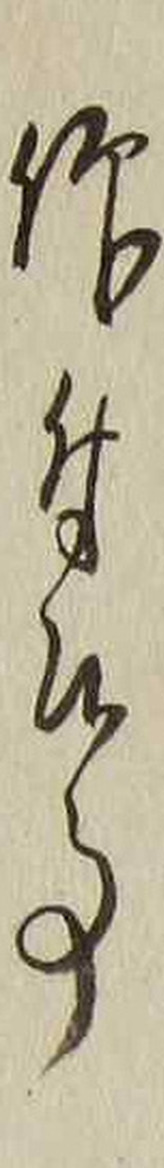仰付候事
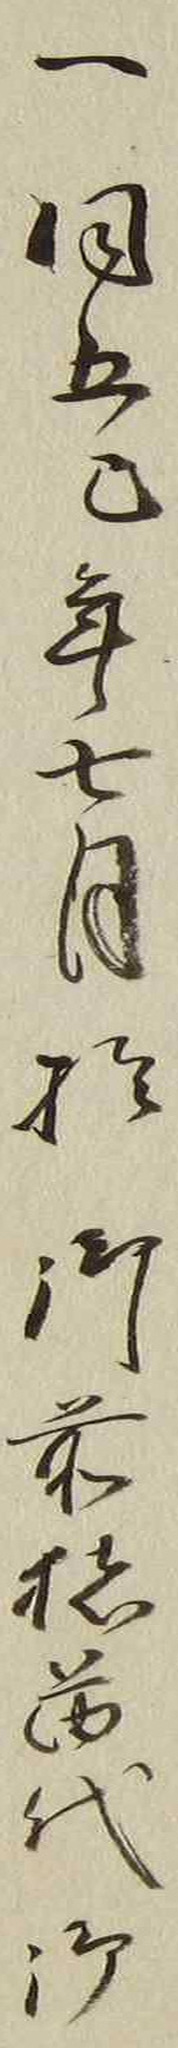一同五巳年七月於御前猪苗代御
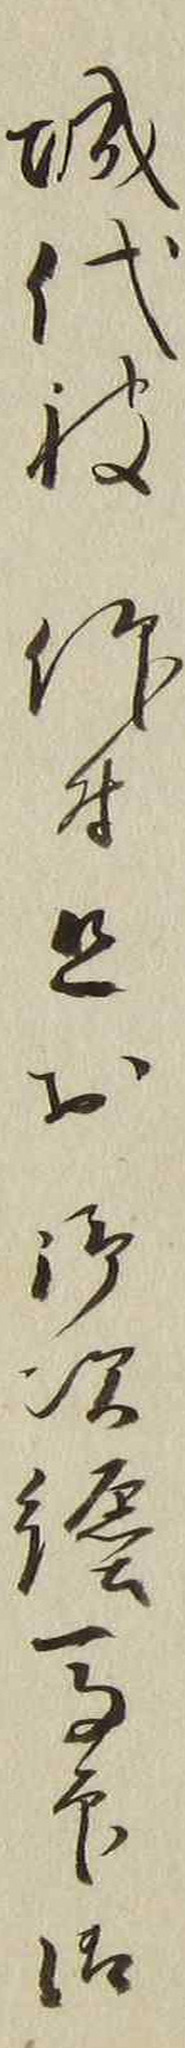城代被仰付且於御次纏馬印御
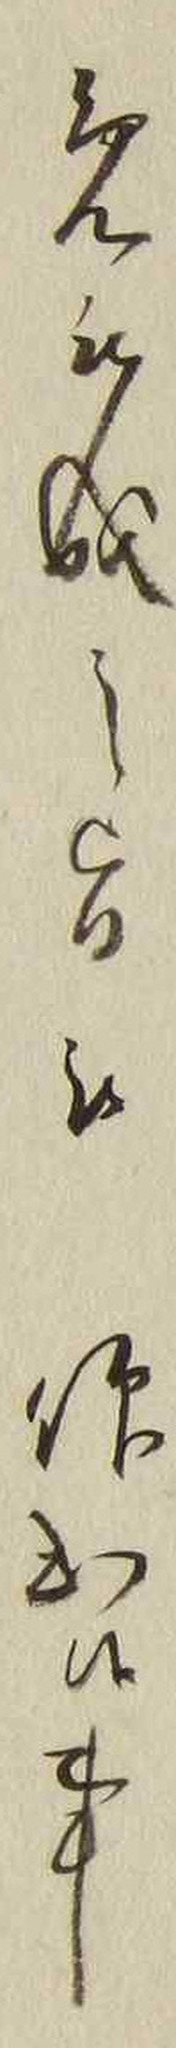免候成之旨被仰出候事

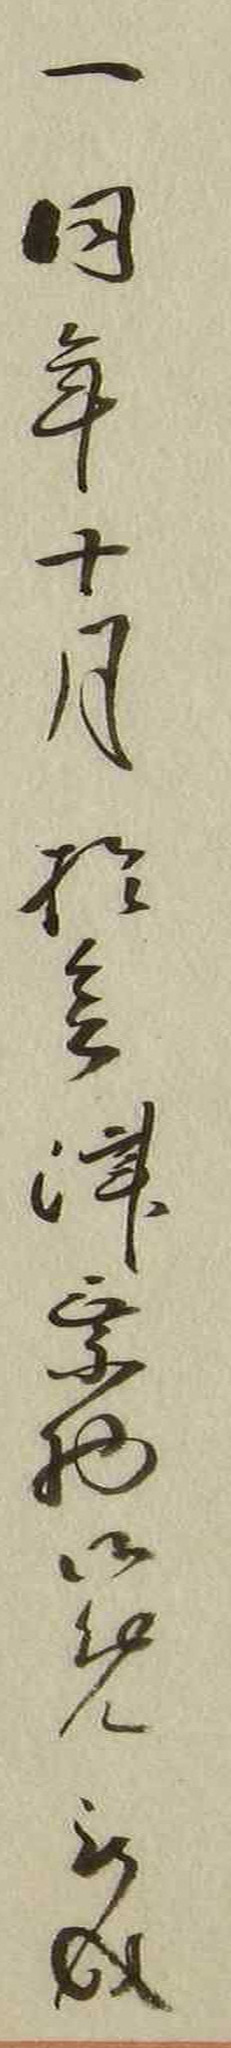一同年十月於会津乗物御免被成
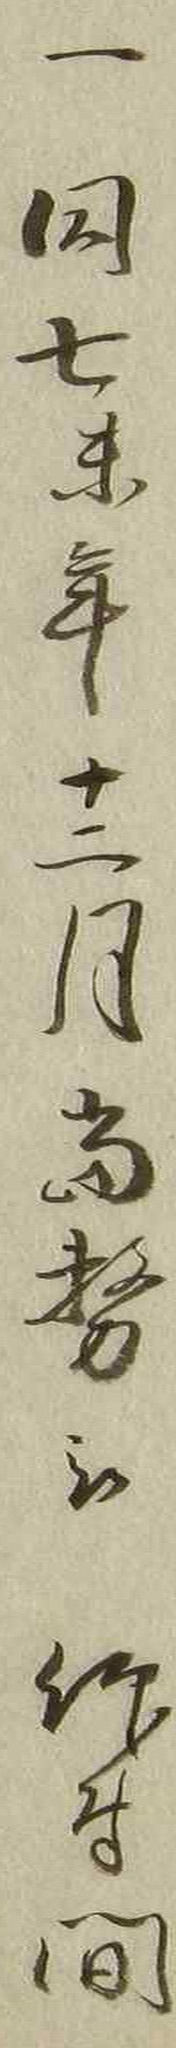一同七未年十二月当務被仰付間
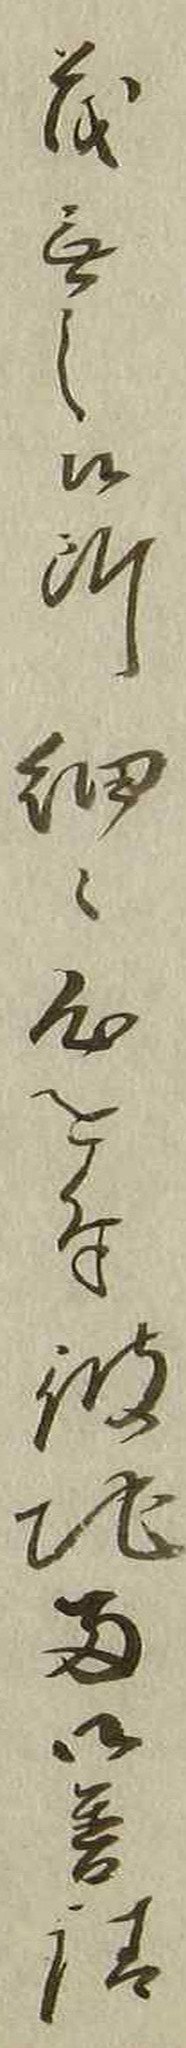も無之候所細々心を付彼地両御普請
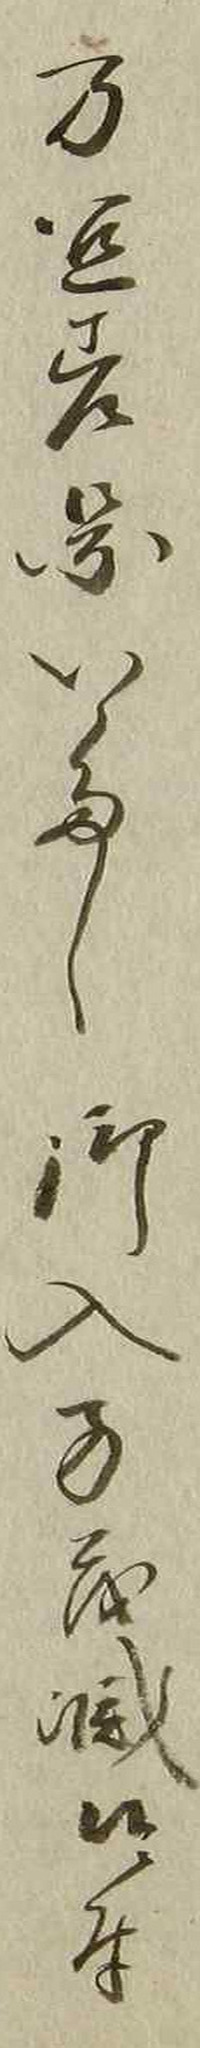方宜差図いたし御入方も減候ニ付
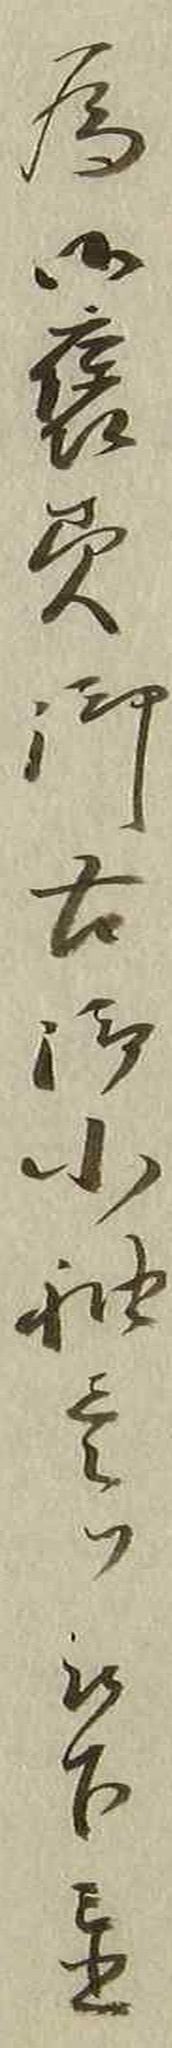為御褒美御古御小袖壱ツ被下置
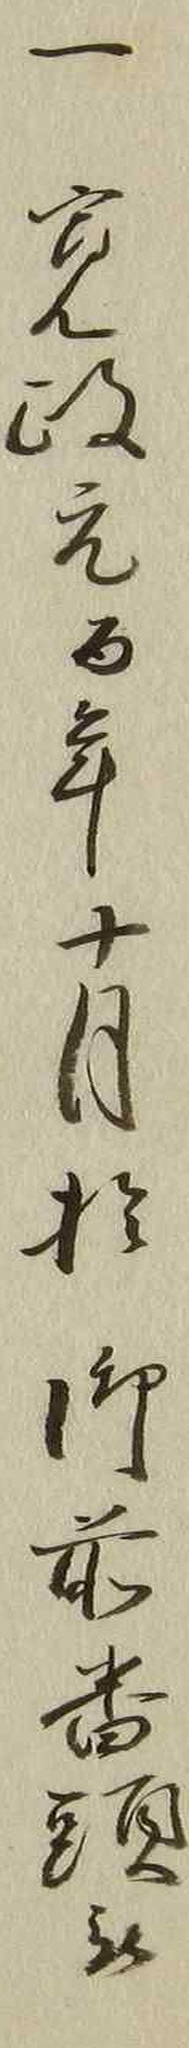一寛政元酉年十月於御前番頭被
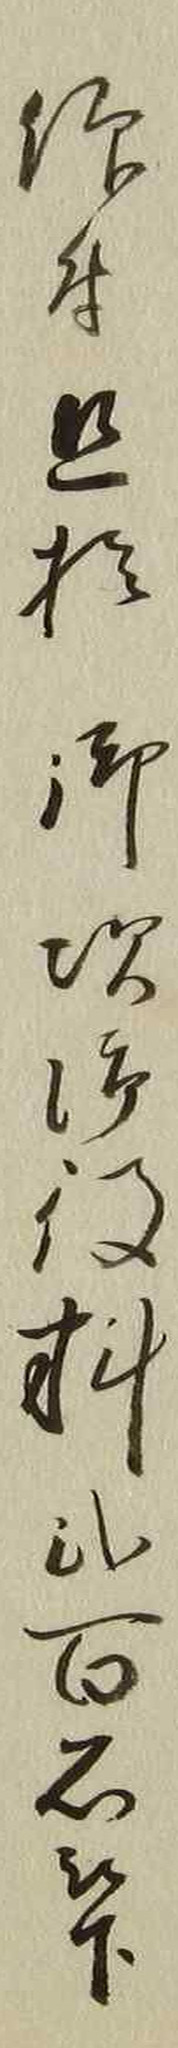仰付且於御次御役料弐百石被下
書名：諸士系譜　巻之122　よ之部5
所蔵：会津若松市立会津図書館
